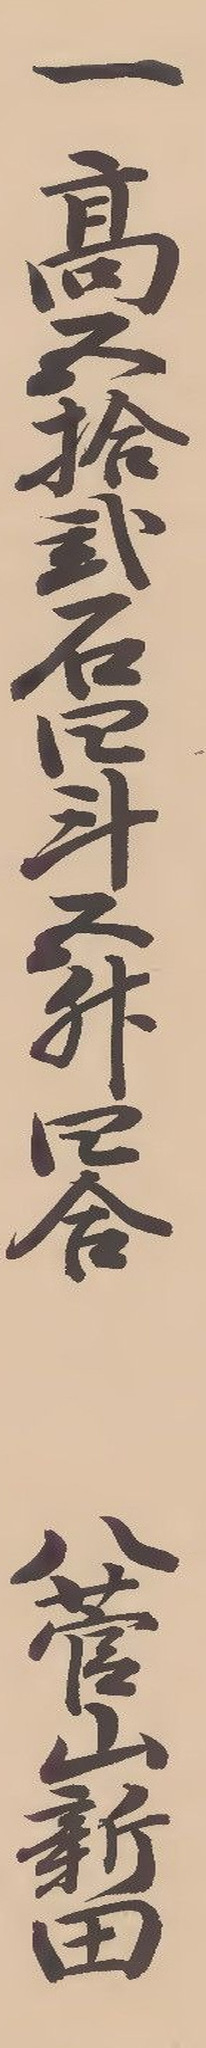一高五拾弐石四斗五升四合八菅山新田
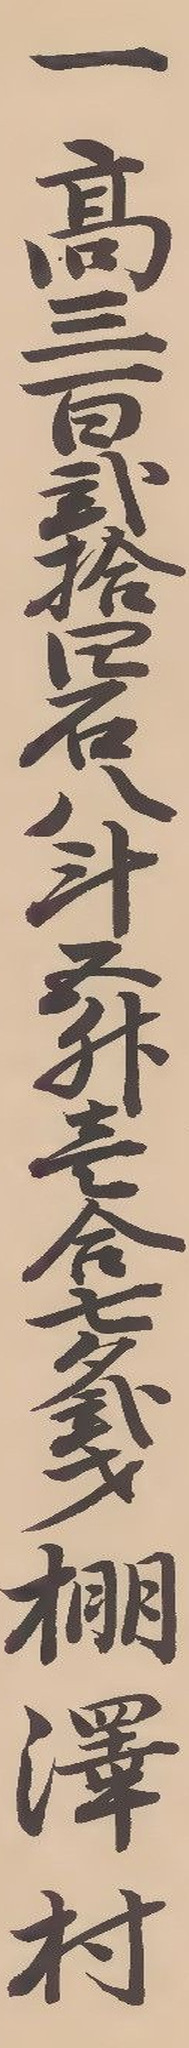一高三百弐拾四石八斗五升壱合七勺弐才棚澤村
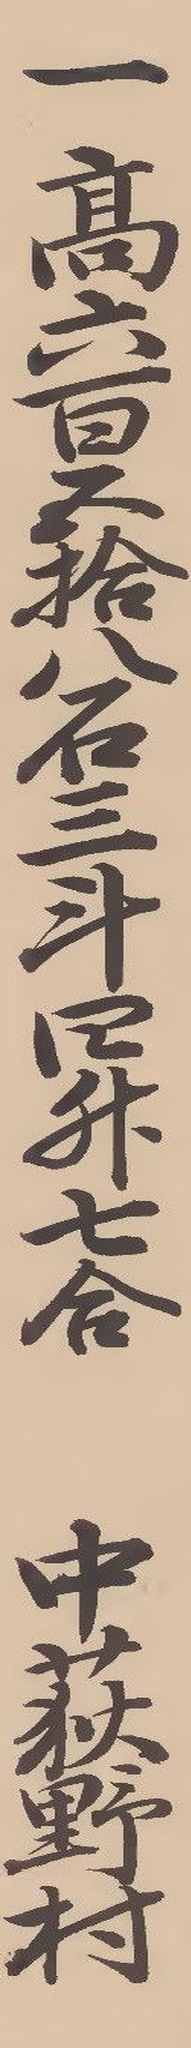一高六百五拾八石三斗四升七合中荻野村
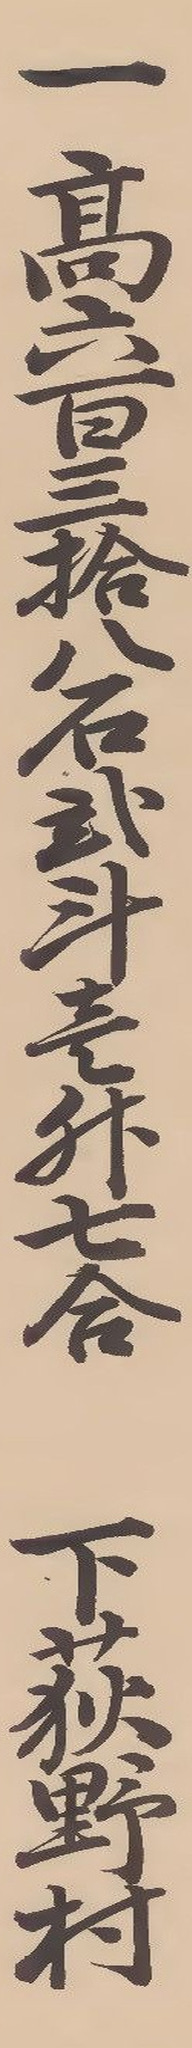一高六百三拾八石弐斗壱升七合下荻野村
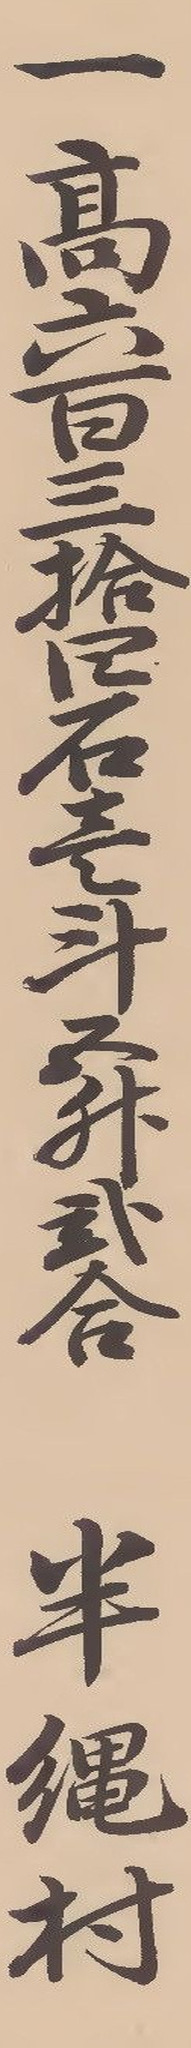一高六百三拾四石壱斗五升弐合半縄村
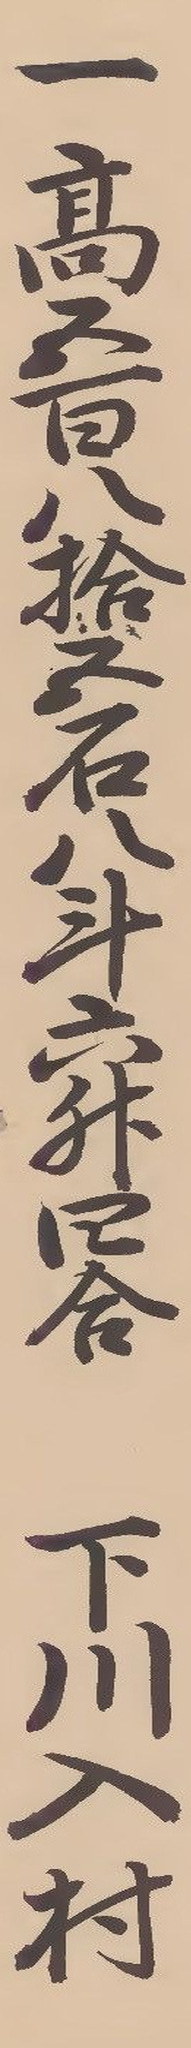一高五百八拾五石八斗六升四合下川入村

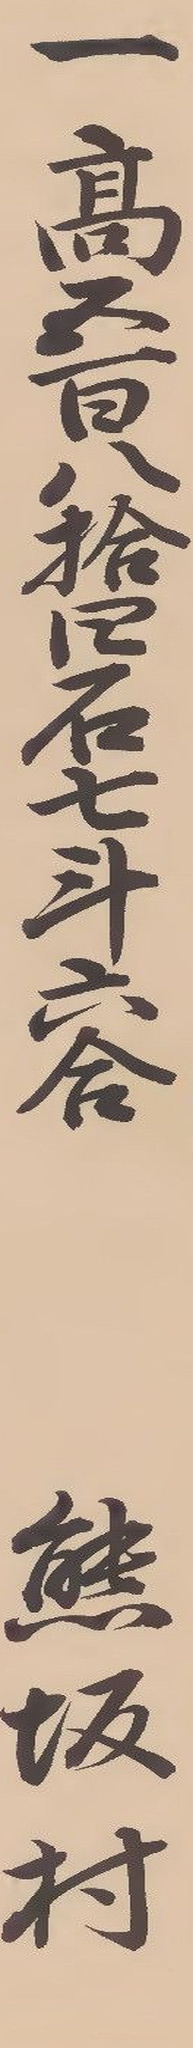一高五百八拾四石七斗六合熊坂村
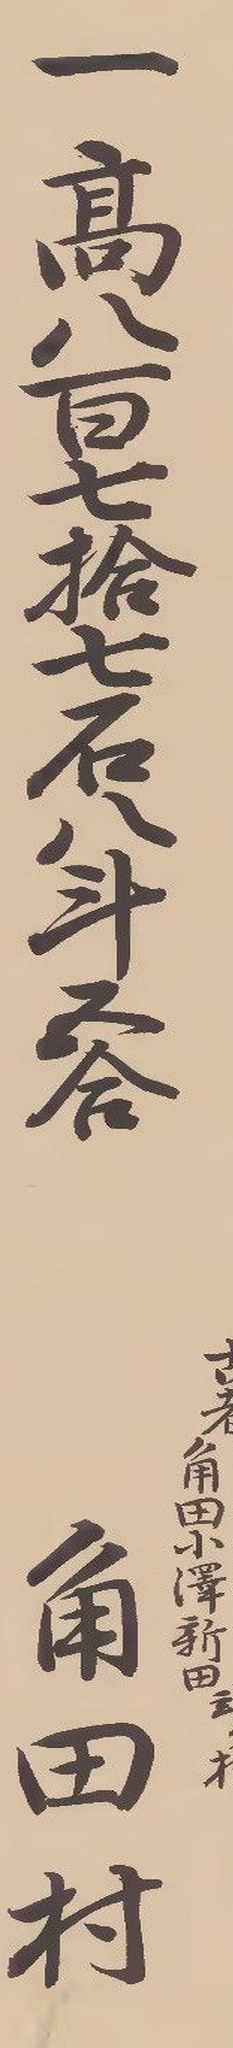一高八百七拾七石八斗五合角田村
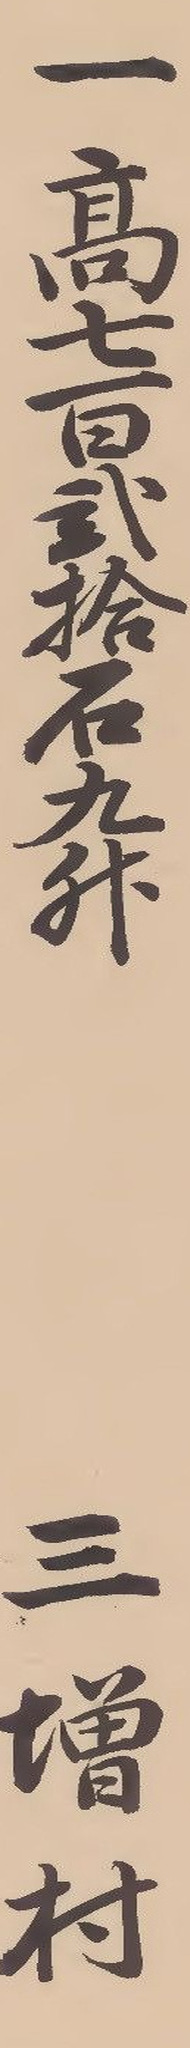一高七百弐拾石九升三増村
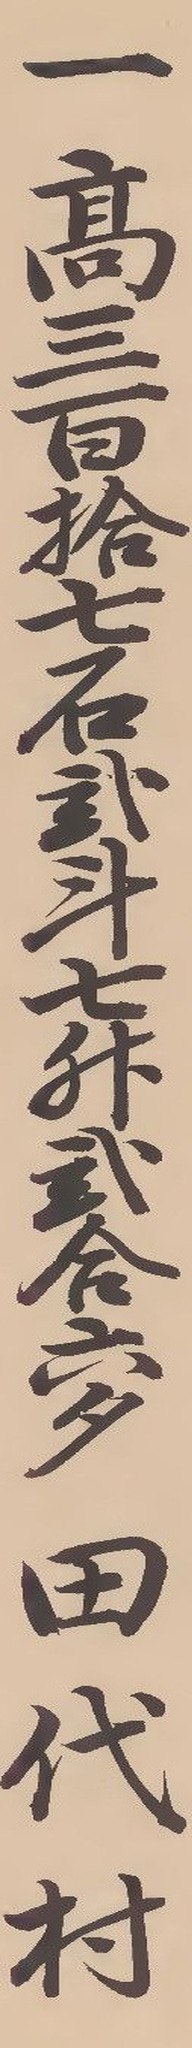一高三百拾七石弐斗七升弐合六勺田代村
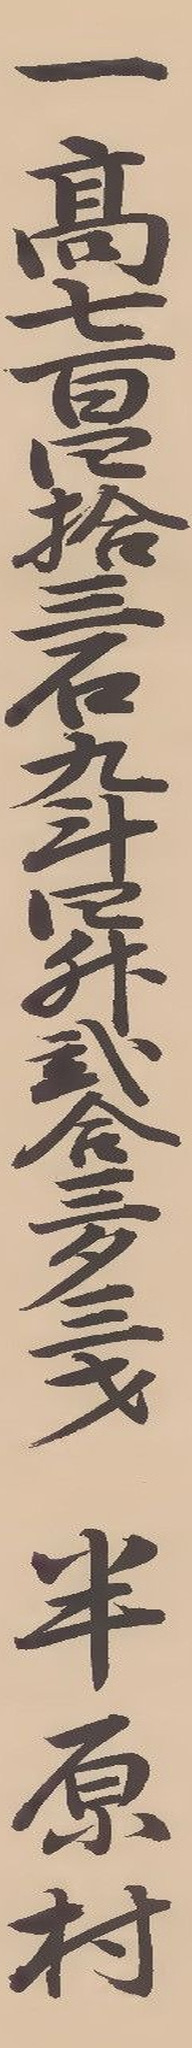一高七百四拾三石九斗四升弐合三勺三才半原村
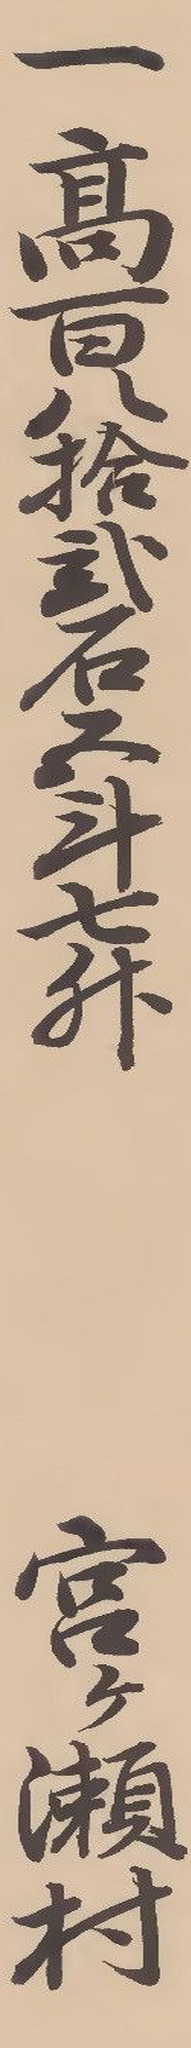一高百八拾弐石五斗七升宮ヶ瀬村
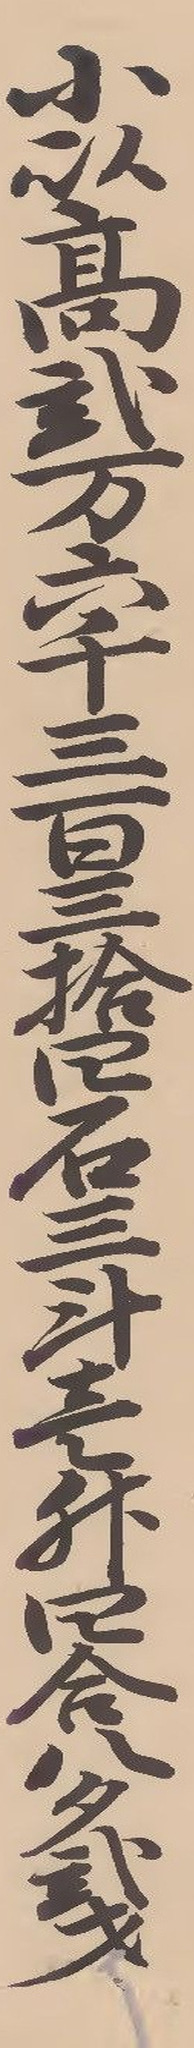小以高弐万六千三百拾四石三斗壱升四合八勺弐才

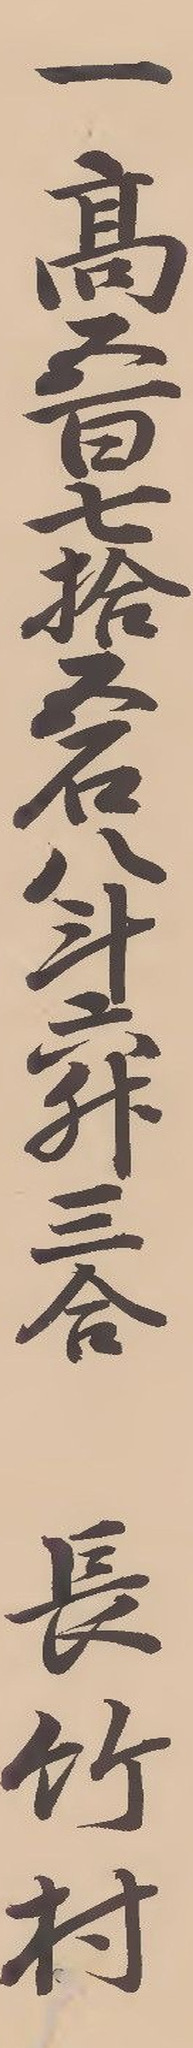一高五百七拾五石八斗六升三合長竹村
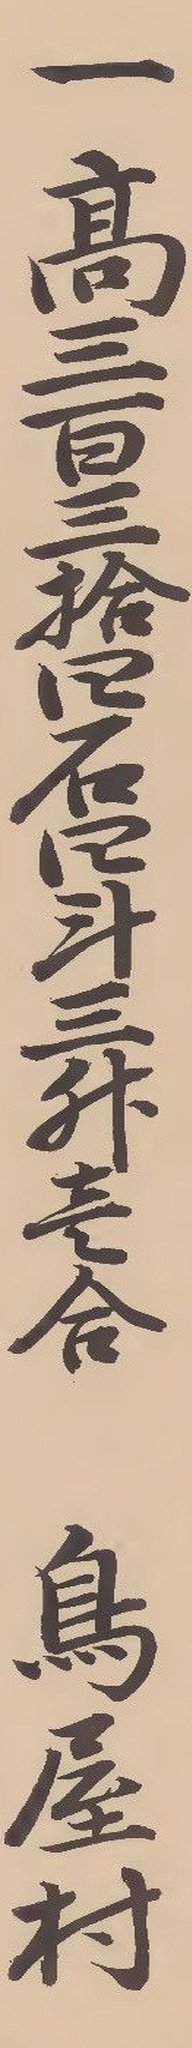一高三百三拾四石四斗三升壱合鳥屋村
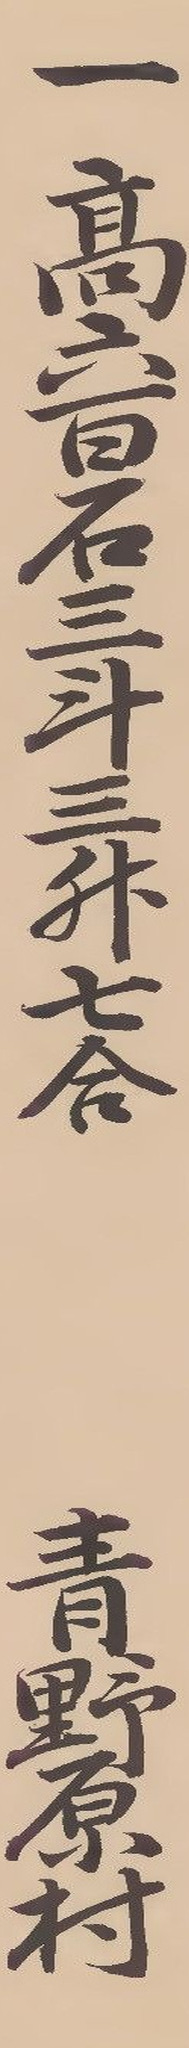一高六百石三斗三升七合青野原村
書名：相模国郷帳
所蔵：国立公文書館 National Archives of Japan
